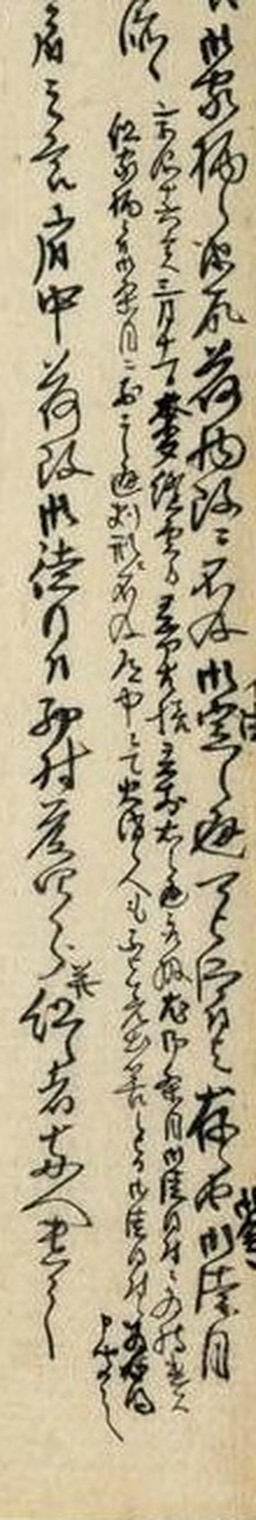但家柄ニ付御条目ニ前々之通判形ニ不及道中ニて火消候人も不被差出筈候旨御徒目付へ相心得申聞之
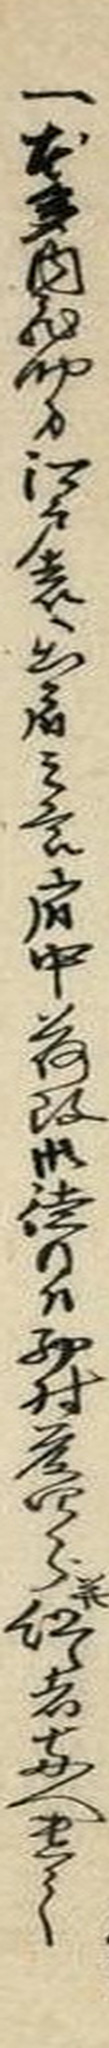一本多内蔵助方江戸表へ出府之節府中荷改御徒目付西村藤四郎幷組之者両人遣之
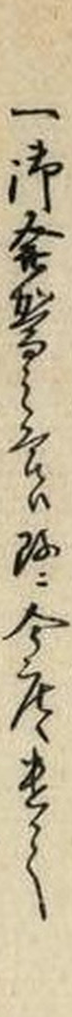一御発駕之節ハ改ニ今庄へ遣之
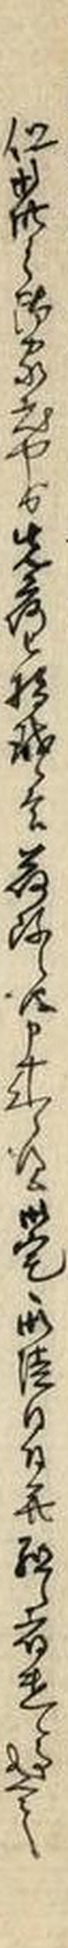但御供之御家老中ゟ先荷被指越候節荷改之儀申来候得共御宅へ御徒目付幷組之者遣候事有之
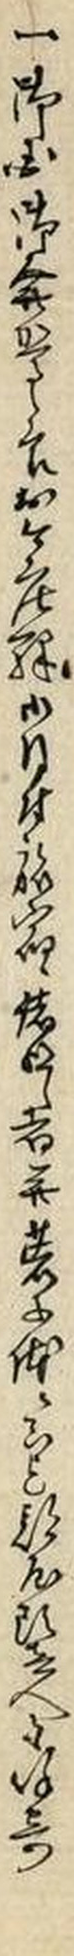一御国御発駕之節於今庄駅御目付旅宿へ諸組之者幷荒子体ニ至迄部屋頭壱人ツヽ呼寄
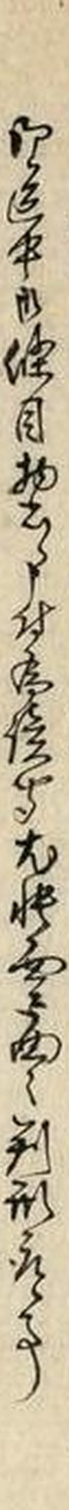御道中御条目物書へ申付為読聞尤帳面ニ面々判形取候事
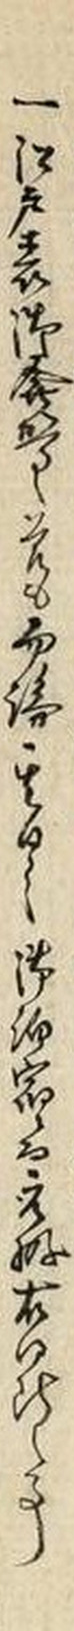一江戸表御発駕之節も勿論其日之御泊宿ニ而取扱右同断之事
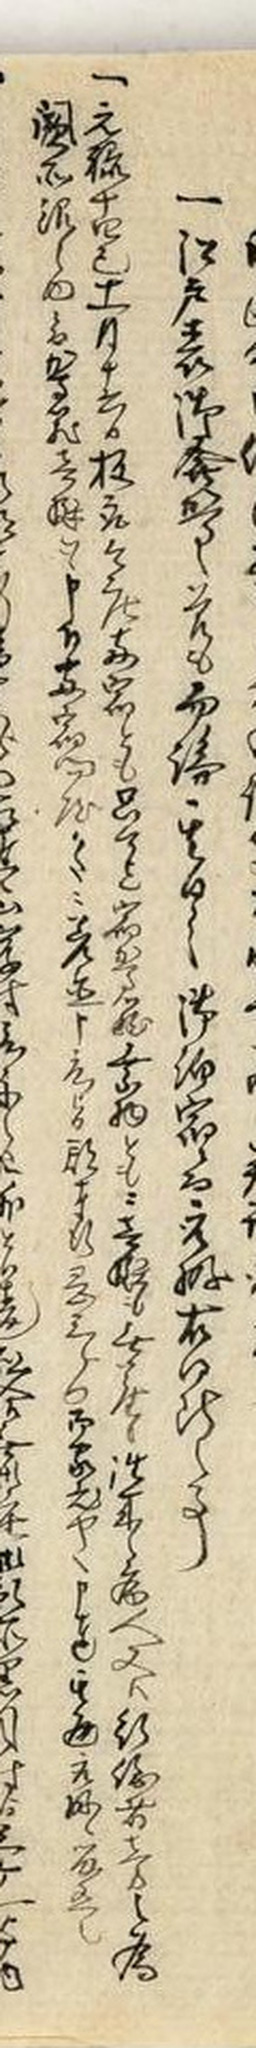一元禄十四巳十一月十六日板取今庄両宿とも只今迄宿駕籠乗物ともニ壱挺も無御座候往来之病人又ハ行倒者旁之為
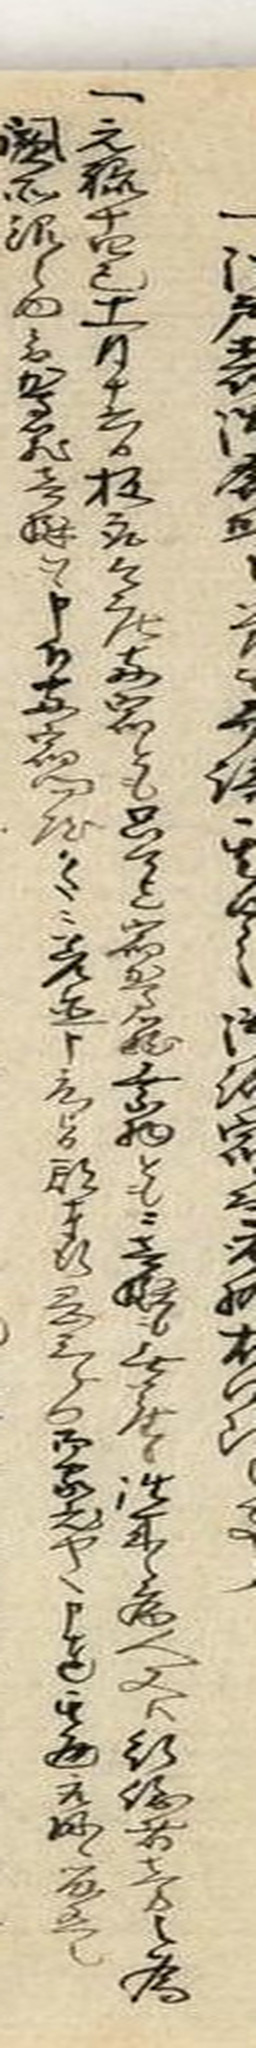闕所銀之内ニ而駕籠壱挺ツヽ申付両宿問屋々々ニ差置申度旨郡奉行岡三郎右衛門御家老中へ申達其通取扱候留有之
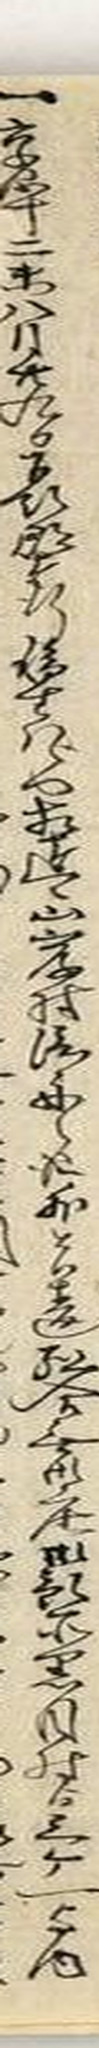一享保十二未八月廿九日下領郡奉行稲生八郎右衛門相達候山岸村渡舟之儀外とハ違組合無御座御預所黒目村ゟ三ケ一与内
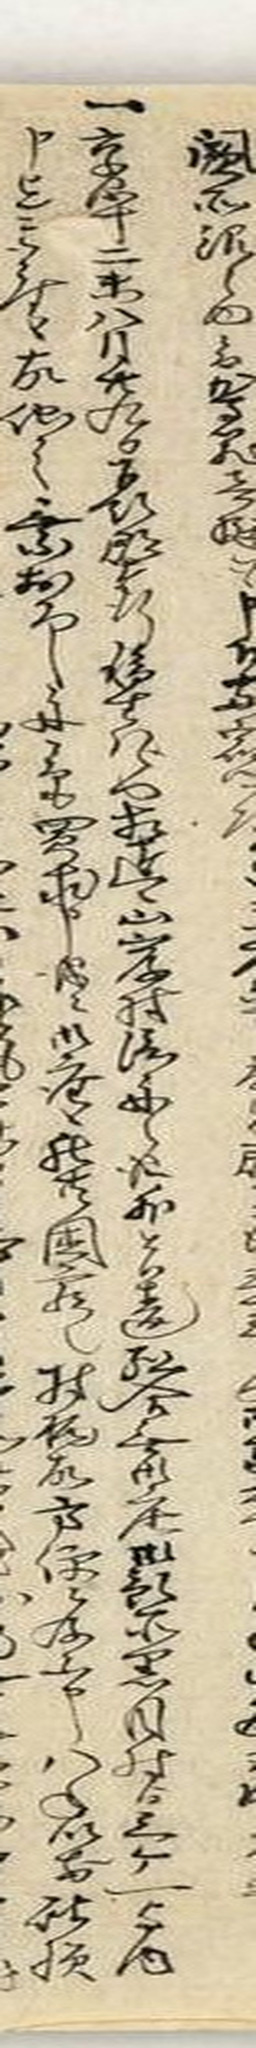申迄ニ御座候故他之乗おろし舟ニ而も買求申儀ニ御座候然共困窮之村柄故方便ニ及不申八年以前破損
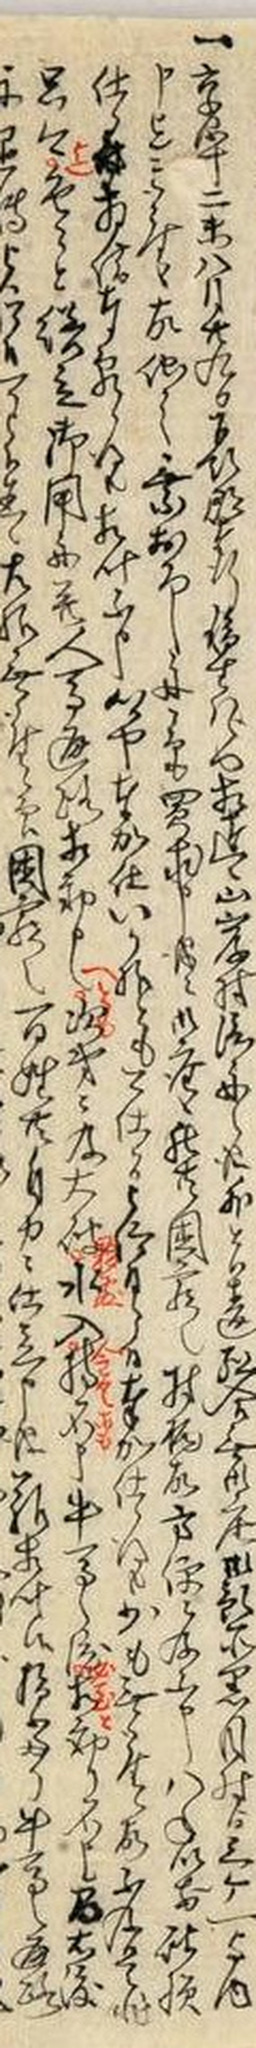仕候拝借奉願候得共相叶不申郷中奉加仕いか様とも可仕旨被仰付候ニ付奉加仕候得共少も無御座候故不及是非
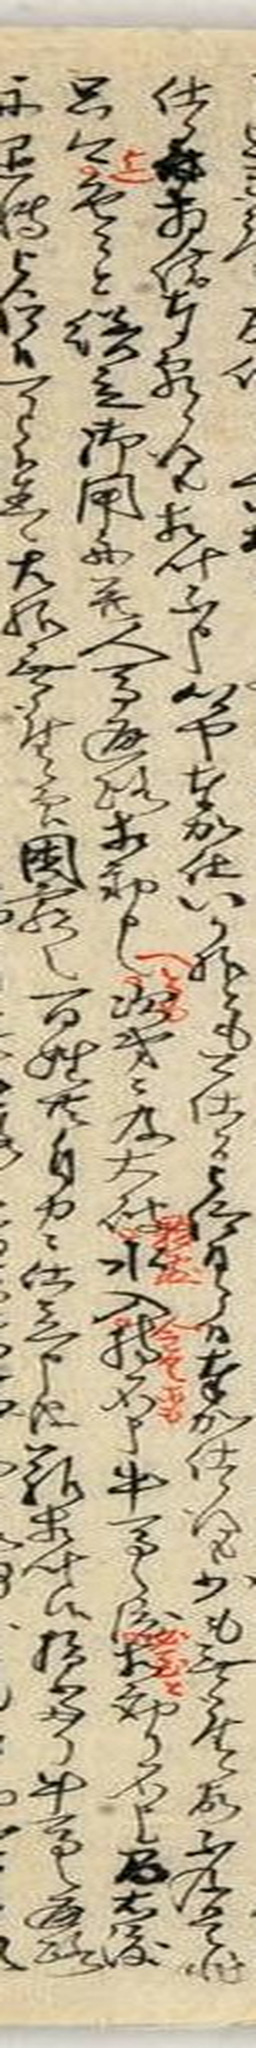舟退転被仰付可被下置候左様無御座候而ハ困窮之百姓共自力ニ仕立申儀難相叶候指当り牛馬之通路
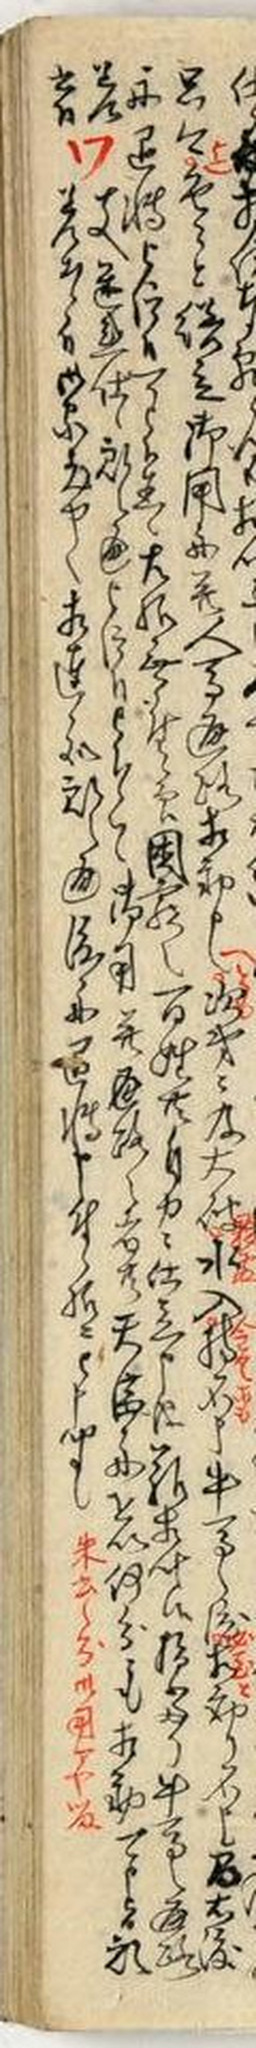差支迷惑仕候願之通被仰付被下候ハヽ御用幷通路之者共天満舟を以何分ニも相勤可申旨願
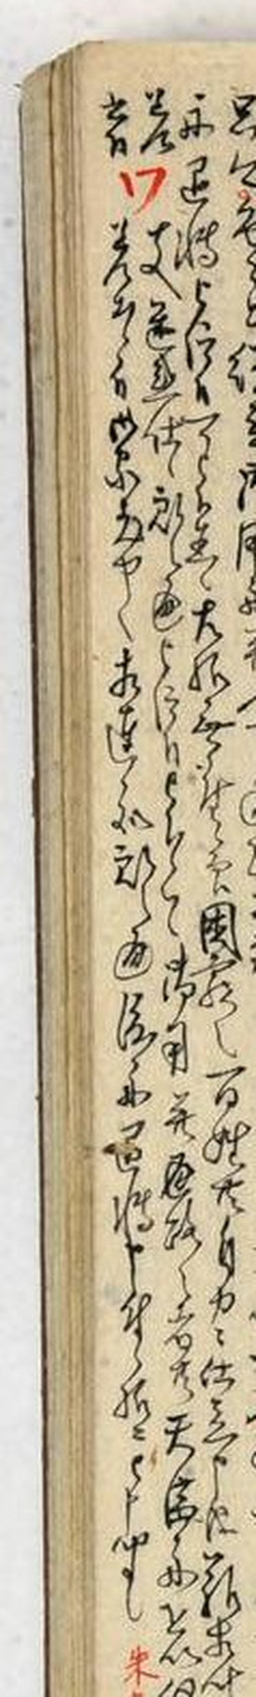書付差出候ニ付御家老中へ相達候処願之通渡舟退転申付候様ニ被申聞候

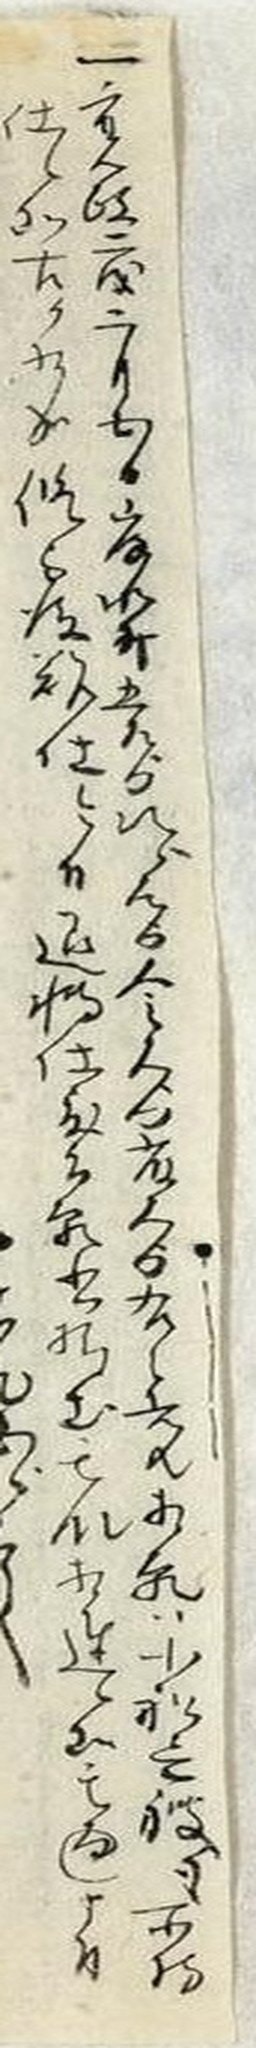仕候所古ク相成修覆難仕候ニ付退転仕度旨願書指出其段相達候処其通申付
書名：御国他国諸事之部
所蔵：福井県文書館 Fukui Prefectural Archives
